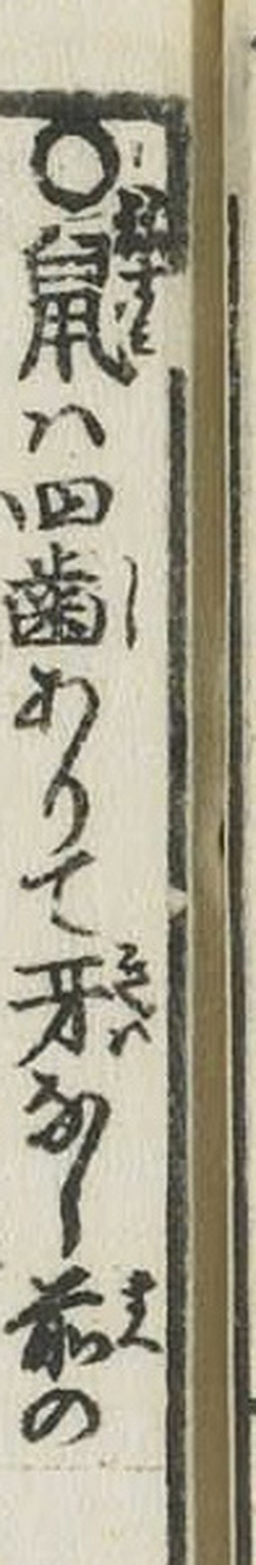○鼠は四歯ありて牙なし前の
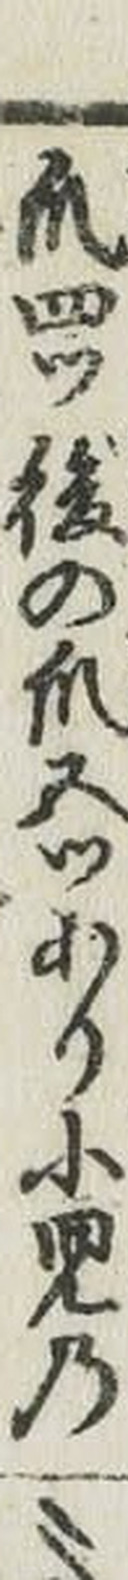爪四ツ後の爪五ツあり小児の
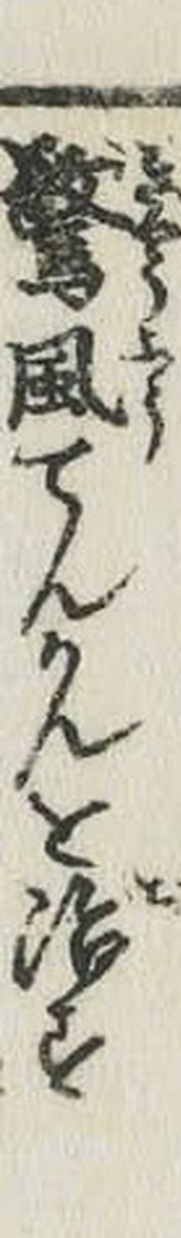驚風てんかんを治す
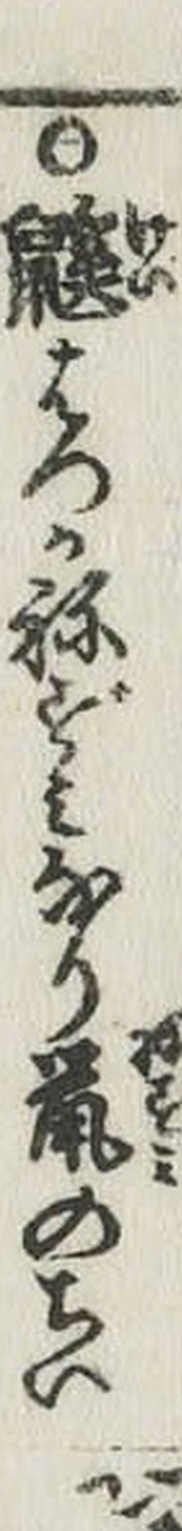○鼷はつかねずみなり鼠のちい
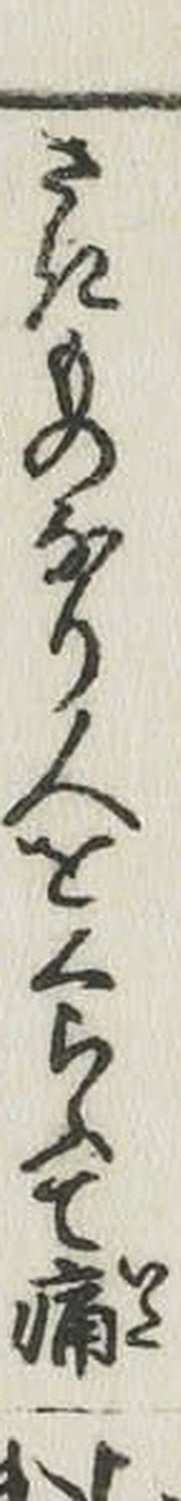さきものなり人をくらふて痛
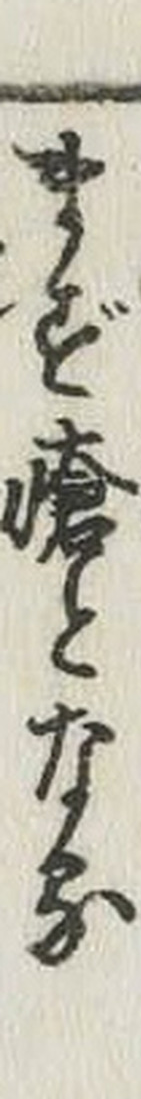まず瘡となる
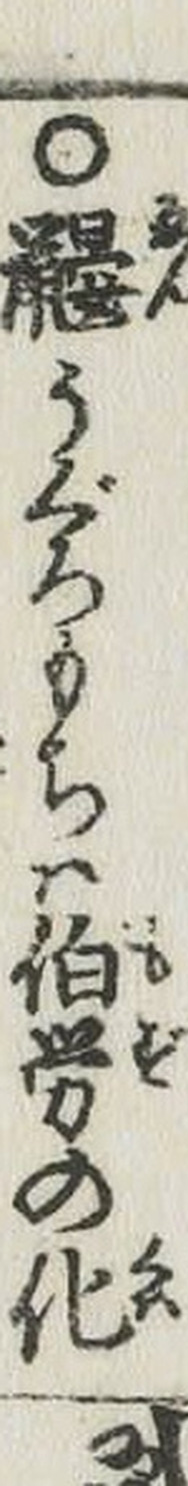○鼹うぐろもちは伯労の化
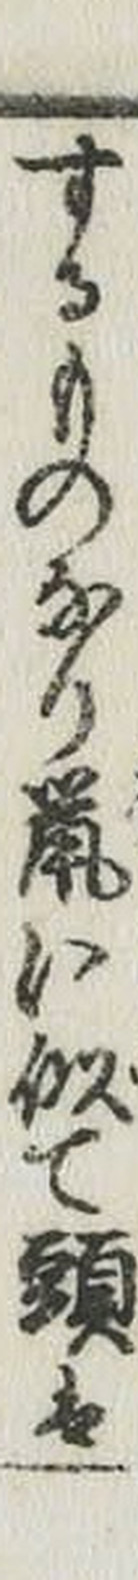するものなり鼠に似て頭は
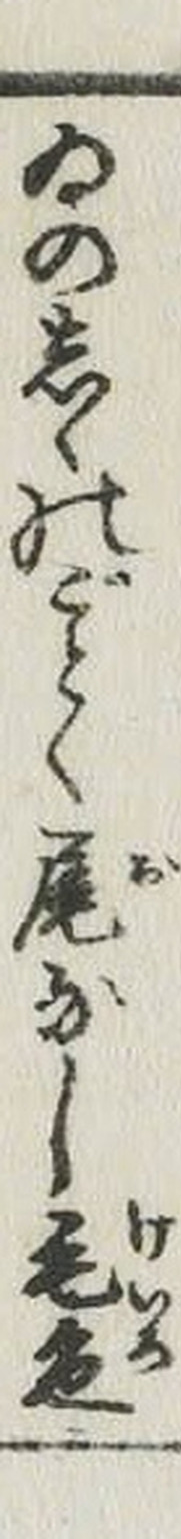ゐのしゝのごとく尾なし毛色
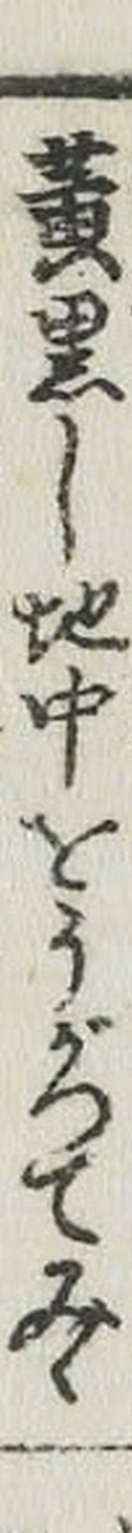黄黒し池中をうがつてみゝ
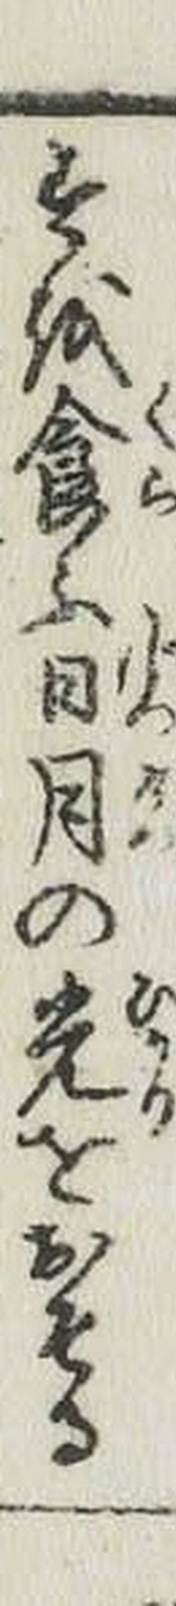すを食ふ日月の光をおそる
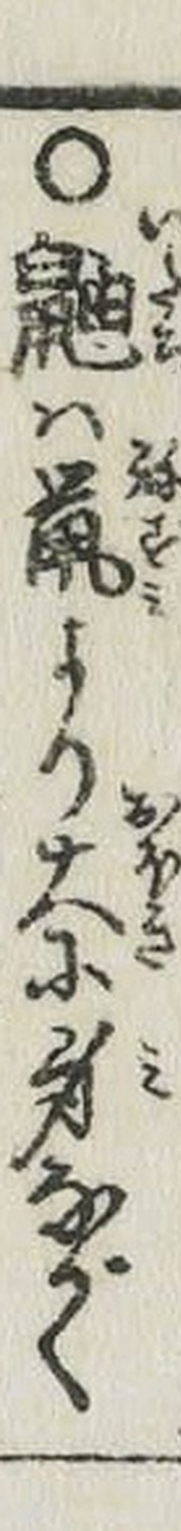○鼬は鼠より大に身ながく
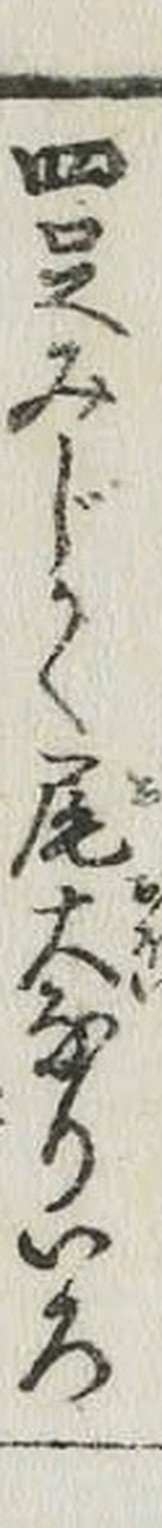四足みじかく尾大なりいろ
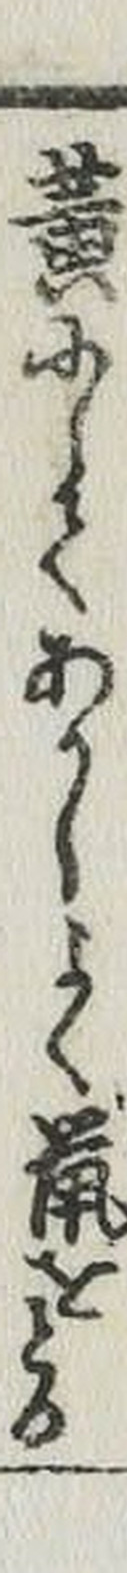黄にしてあかしよく鼠をとる
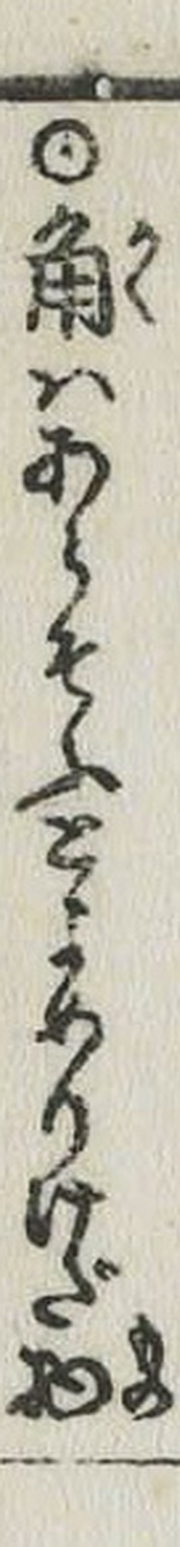○角はあらそふとよめりけだ物
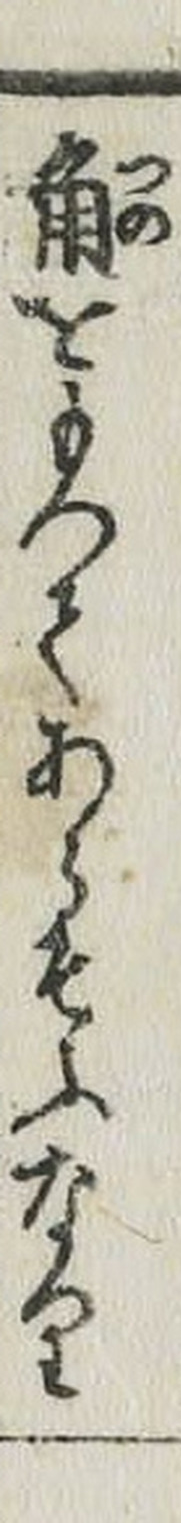角をもつてあらそふなり
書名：増補頭書訓蒙図彙大成 10巻 6:巻之12-13
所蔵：東京学芸大学教育コンテンツアーカイブ
